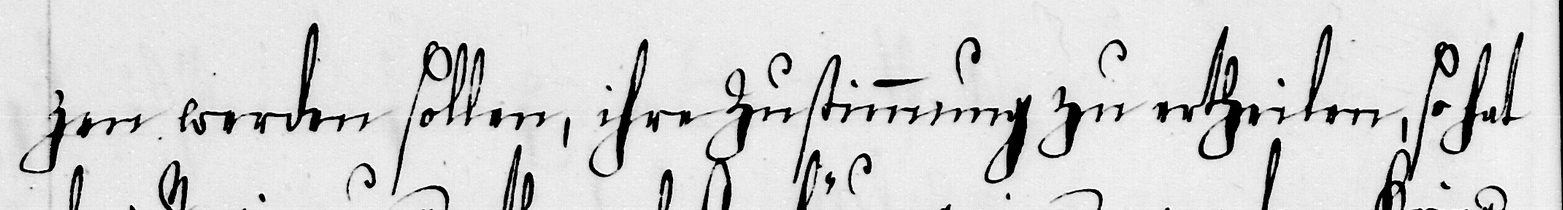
zen werden sollen, ihre Zustimmung zu ertheilen, so hat
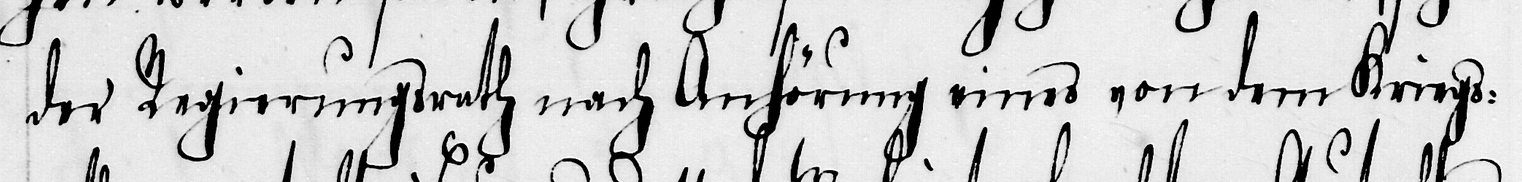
der Regierungsrath nach Anhörung eines von dem Kriegs¬
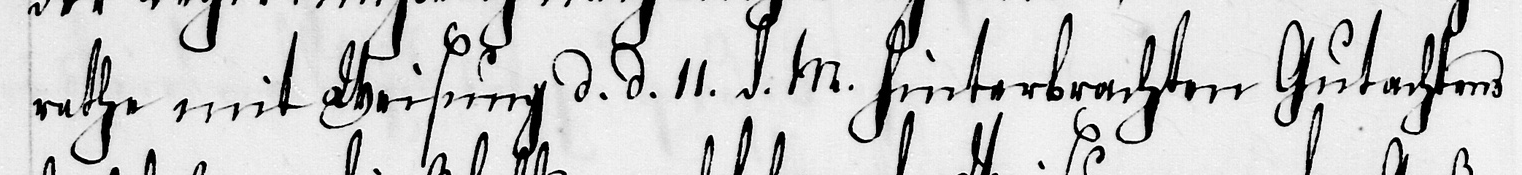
rathe mit Weisung d. d. 11. d. M. hinterbrachten Gutachtens
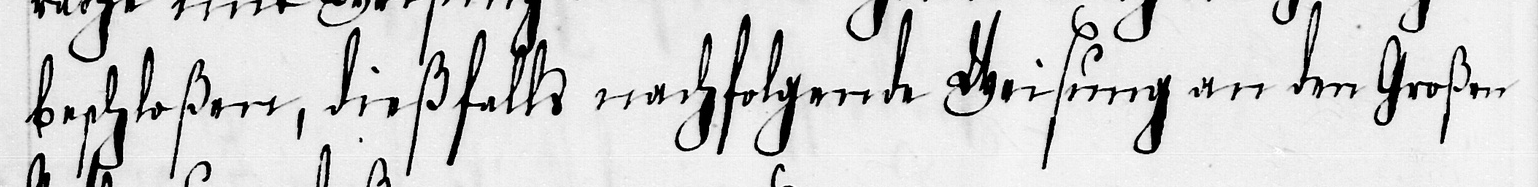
beschloßen, dießfalls nachfolgende Weisung an den Großen
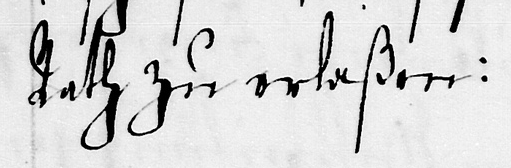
Rath zu erlaßen:
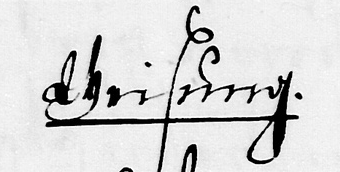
Weisung.
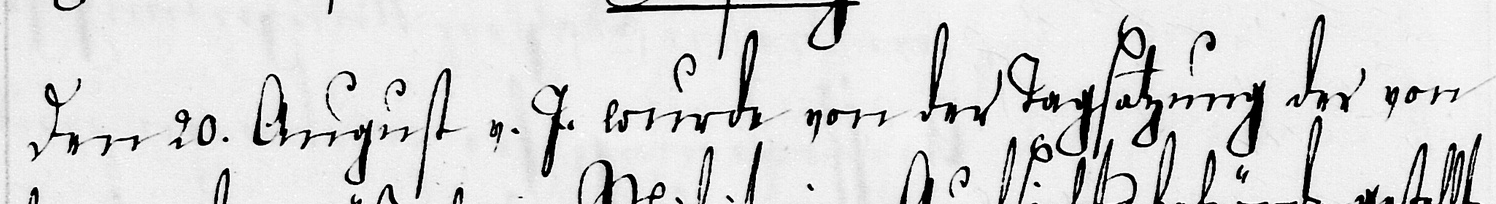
Den 20. August v. J. wurde von der Tagsatzung der von
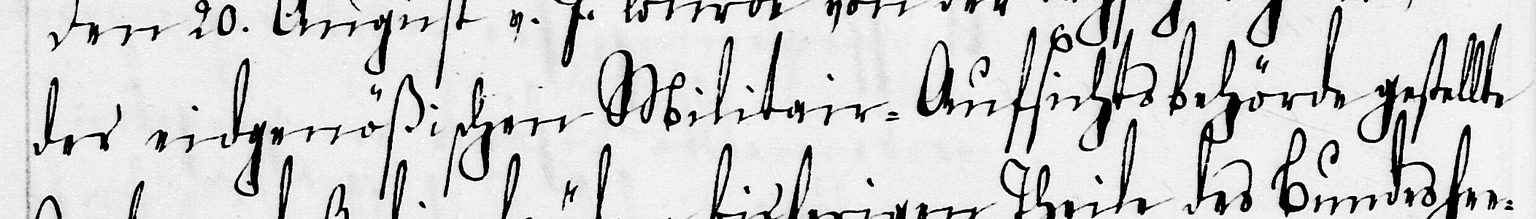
der eidgenößischen Militair-Aufsichtsbehörde gestel¬
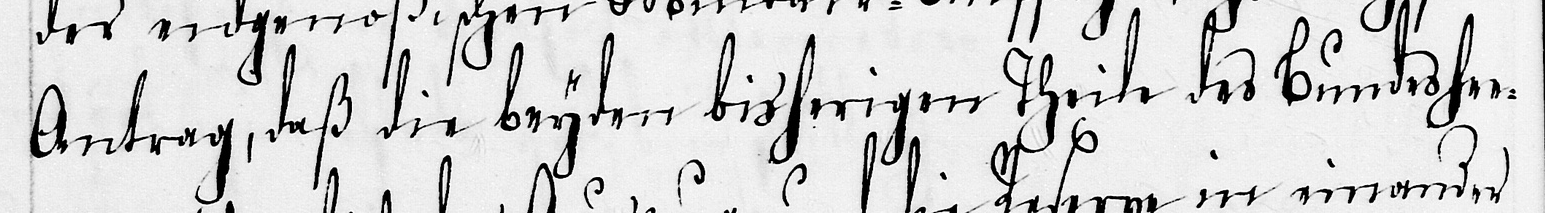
Antrag, daß die beyden bisherigen Theile des Bundeshe¬
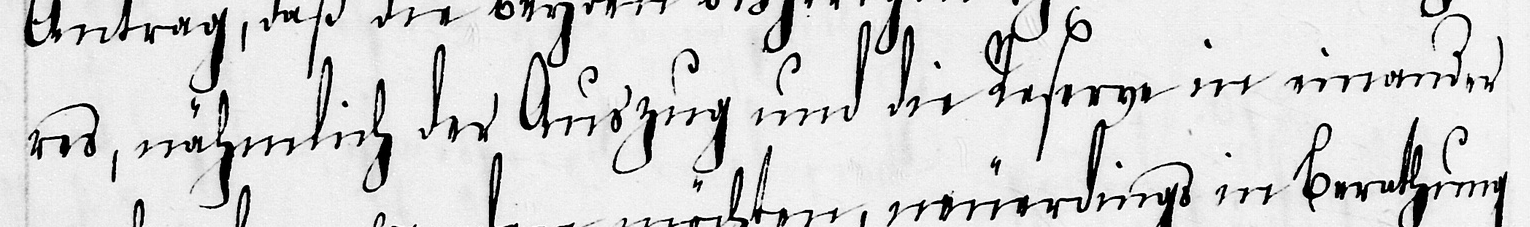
eres, nähmlich der Auszug und die Reserve in einander
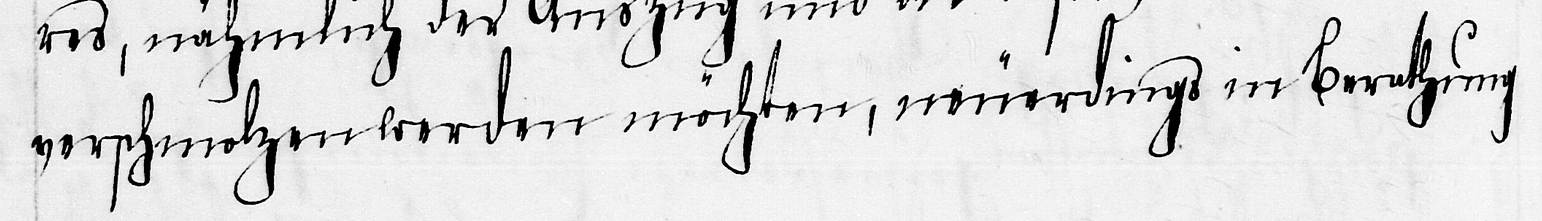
verschmolzen werden möchten, neuerdings in Berathung
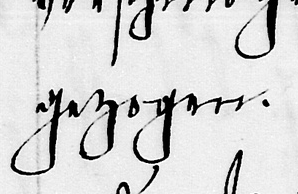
gezogen.
